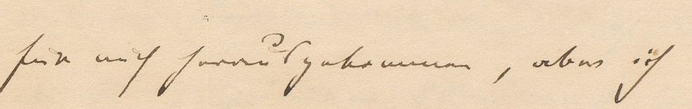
für mich herausgekommen, aber ich
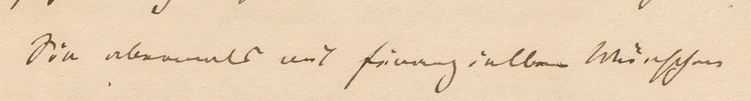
Sie abermals mit finanziellen Wünschen
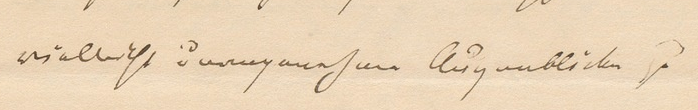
vielleicht unangenehme Augenblicke zu
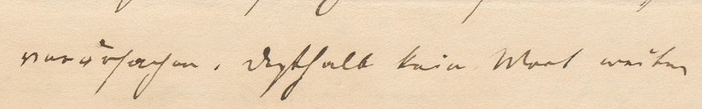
verursachen. Deßhalb kein Wort weiter
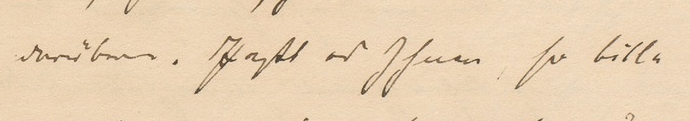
darüber. Paßt es Ihnen, so bitte
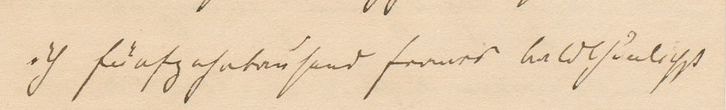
ich fünfzehntausend francs baldthunlichst
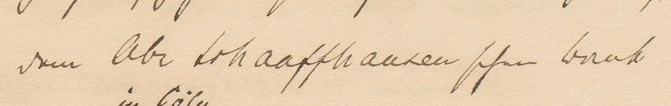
dem Abr Schaaffhausenschen Bank
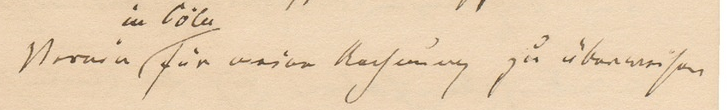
Verein in Cöln für meine Rechnung zu überweisen
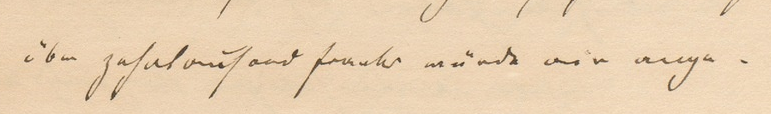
über zehntausend Franks würde mir ange-
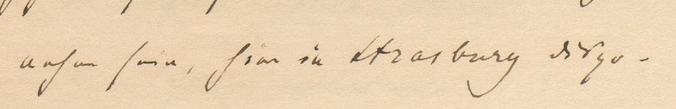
nehm sein, hier in Strasburg dispo-
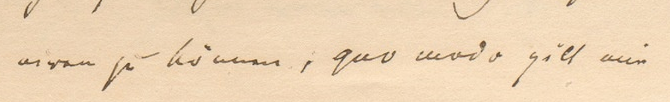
niren zu können, quo modo gilt mir
